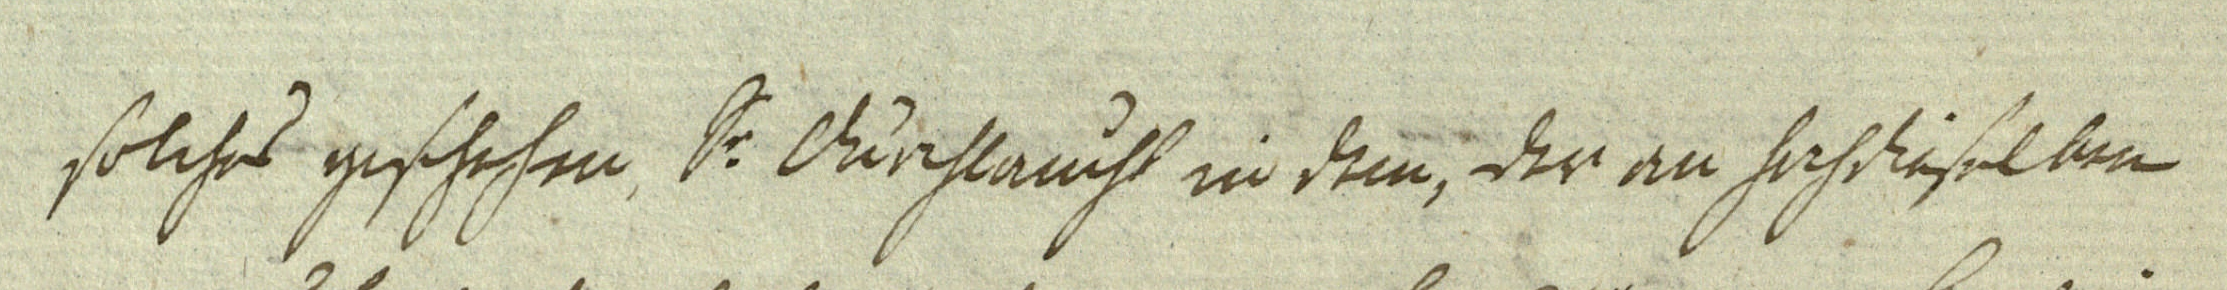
solches geschehen, Sr Durchlaucht in dem, der an hochdieselben
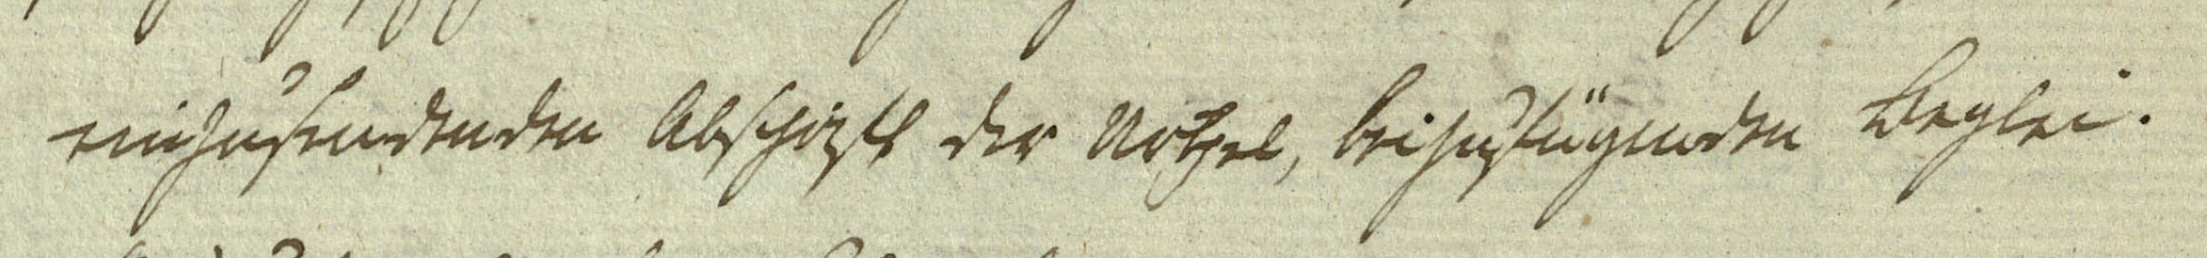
einzusendenden Abschrift der Urthel, beizufügenden Beglei¬
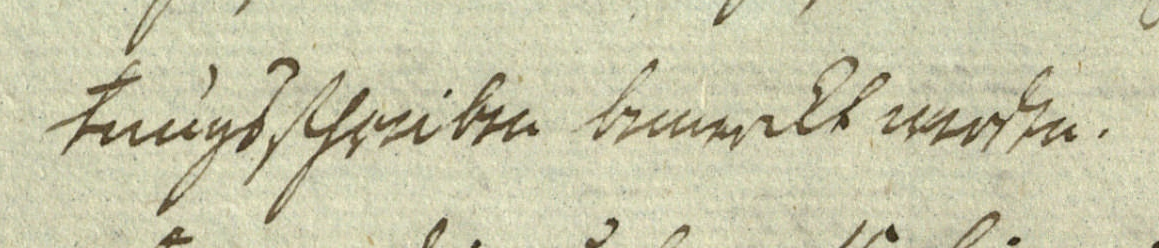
tungschreiben bemerckt werden.
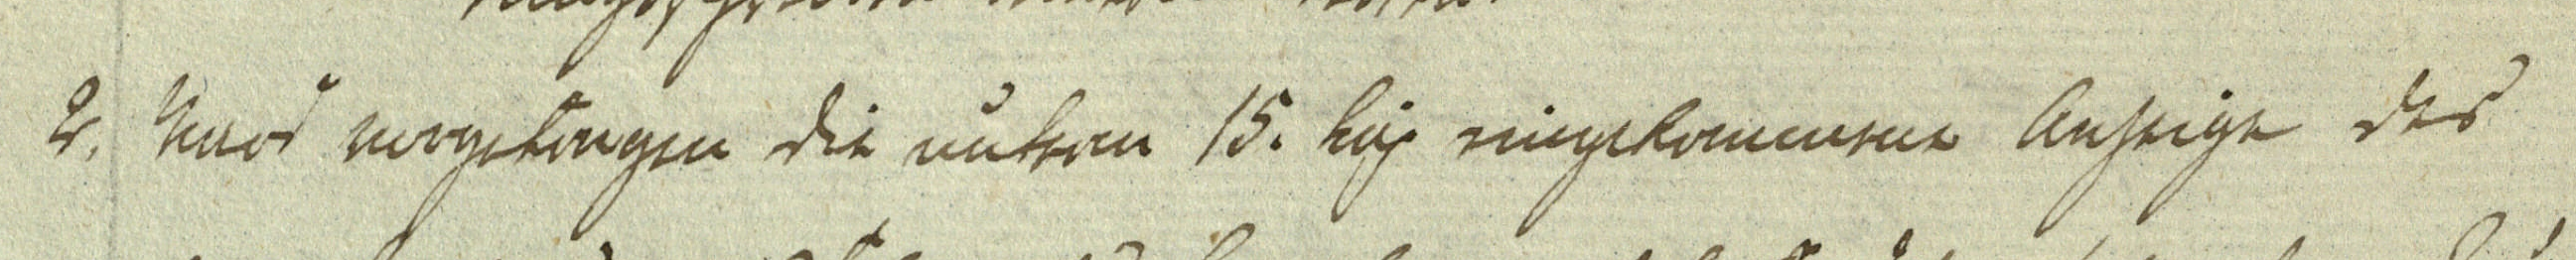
2, Ward vorgetragen die unterm 15. huj. eingekommene Anzeige des
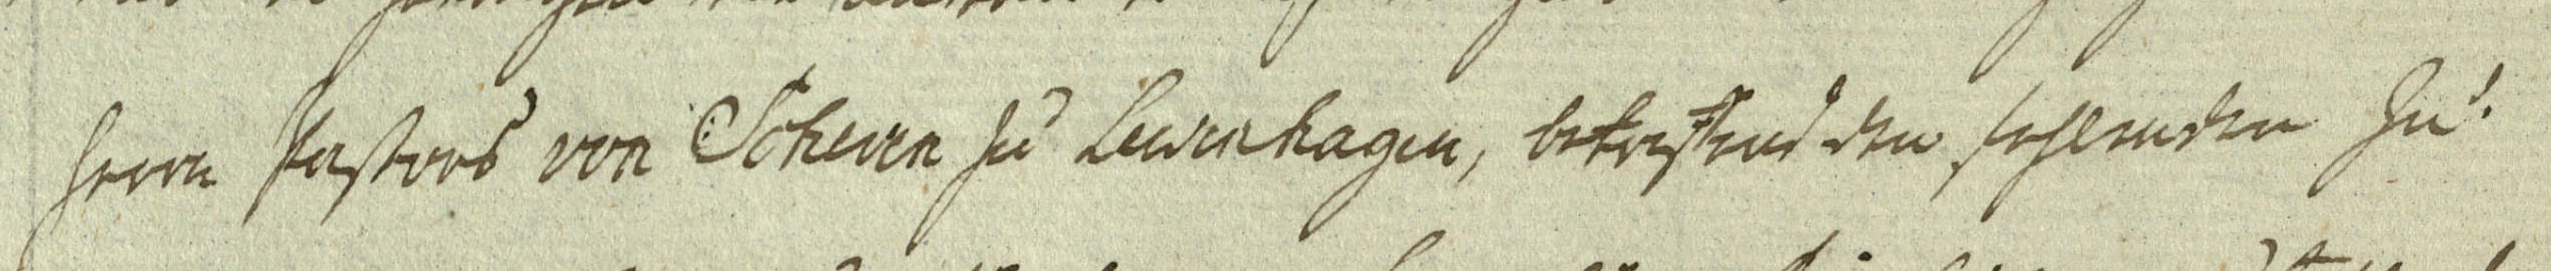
Herrn Pastors von Scheven zu Lewenhagen, betreffend den fehlenden Zu¬
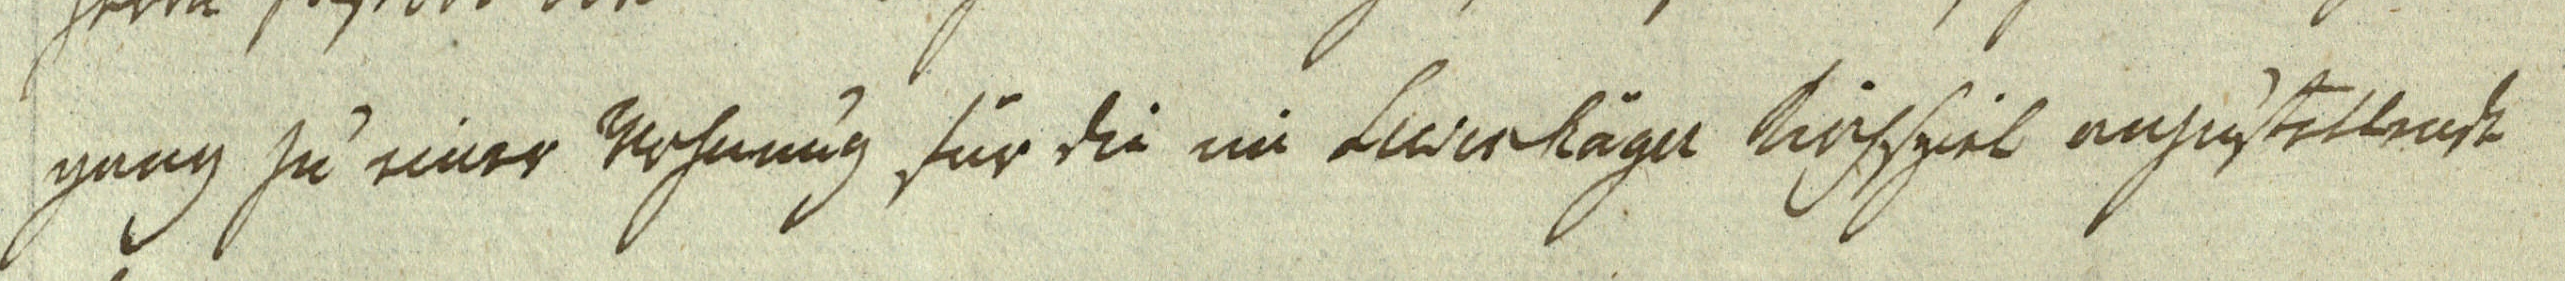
gang zu einer Wohnung für die im Lewenhäger Kirchspiel anzustellende
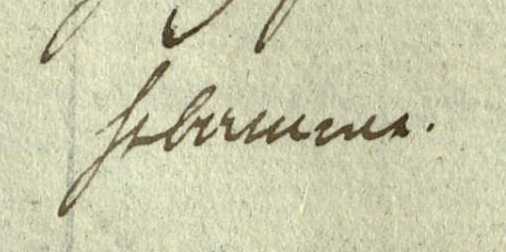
Hebamme.
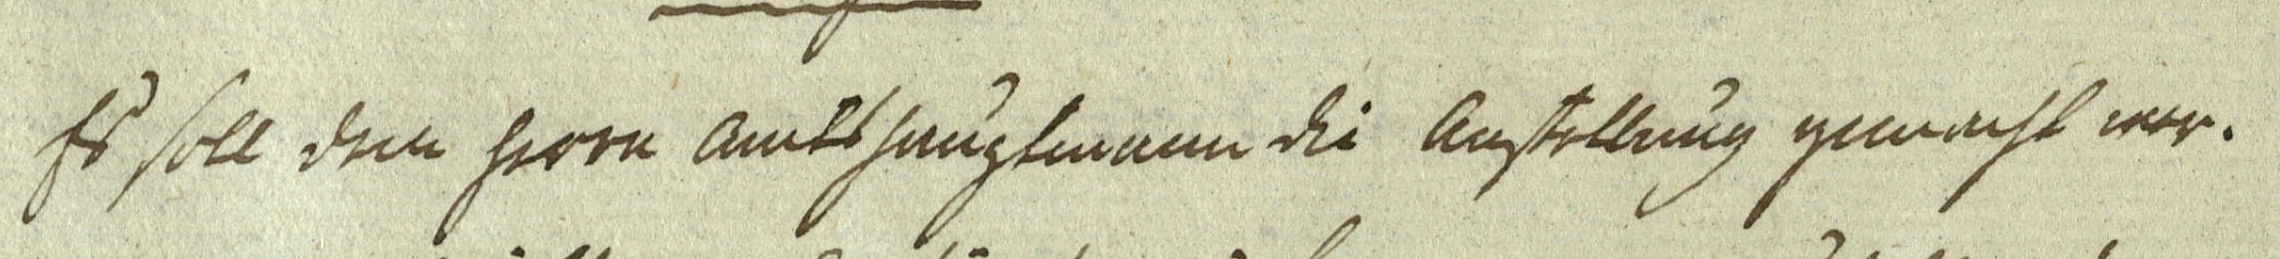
Es soll dem Herrn Amtshauptmann die Anstellung gemacht wer¬
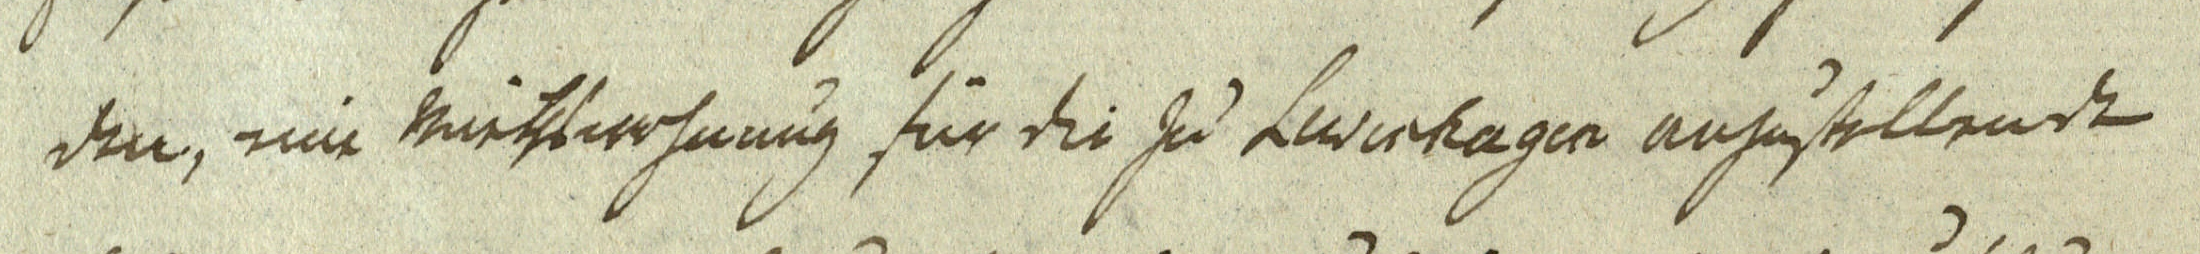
den, eine Miethswohnung für die zu Lewenhagen anzustellende
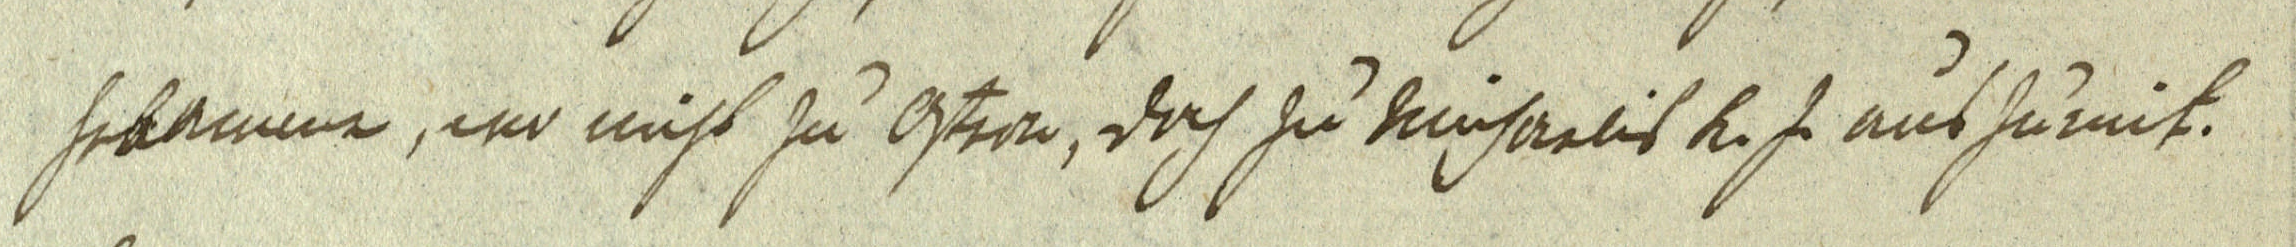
Hebamme, wo nicht zu Ostern, doch zu Michaelis k. J. aus zumit¬
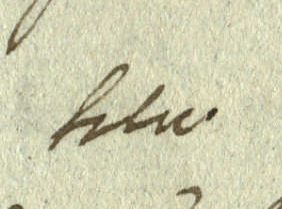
teln.
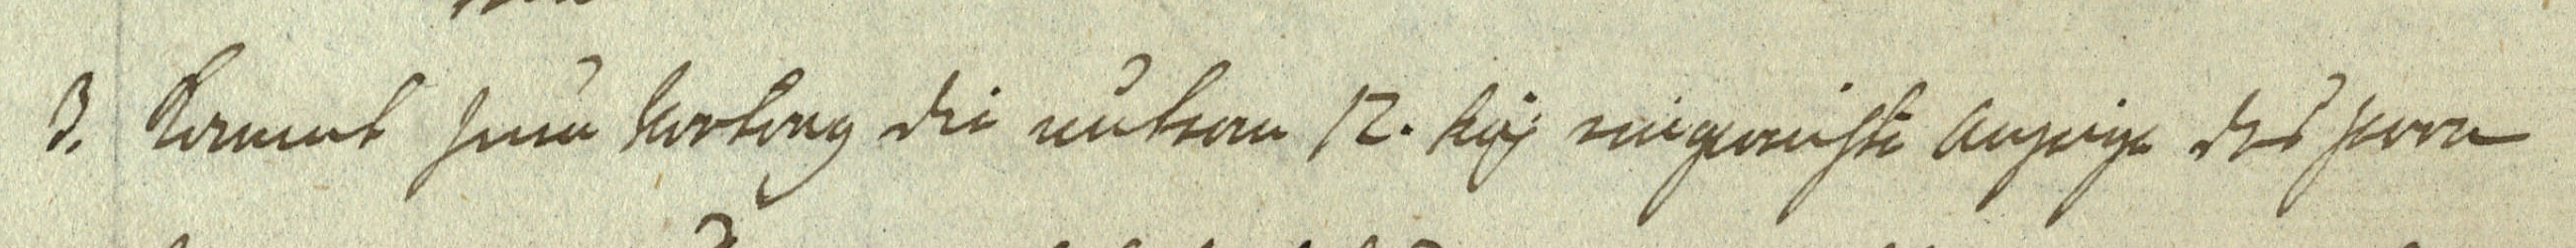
3. Kommt zum Vortrag die unterm 12. huj eingereichte Anzeige des Herrn
